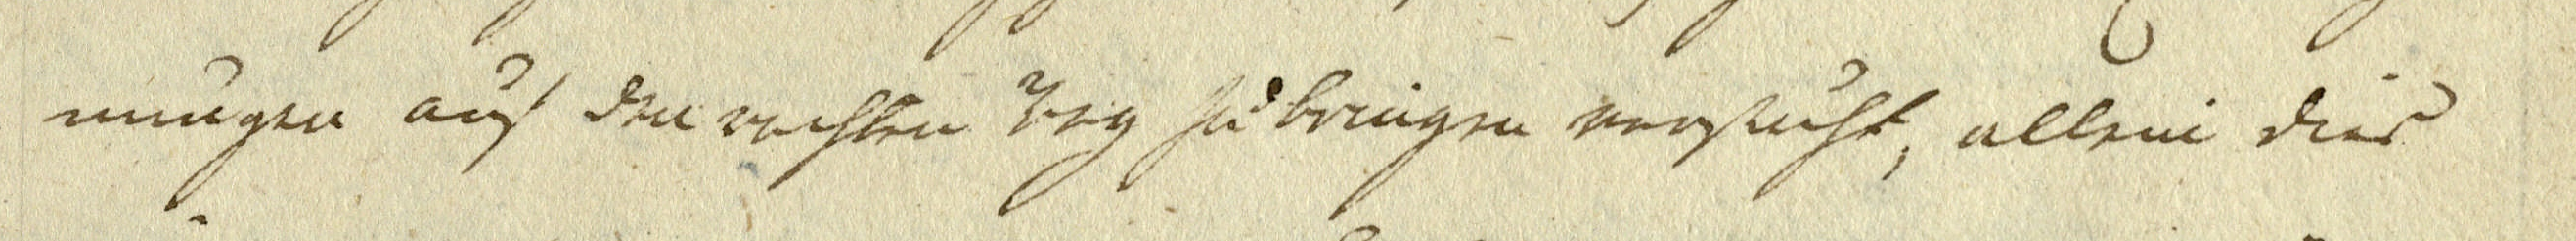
nungen auf den rechten Weg zu bringen versucht, allein dies
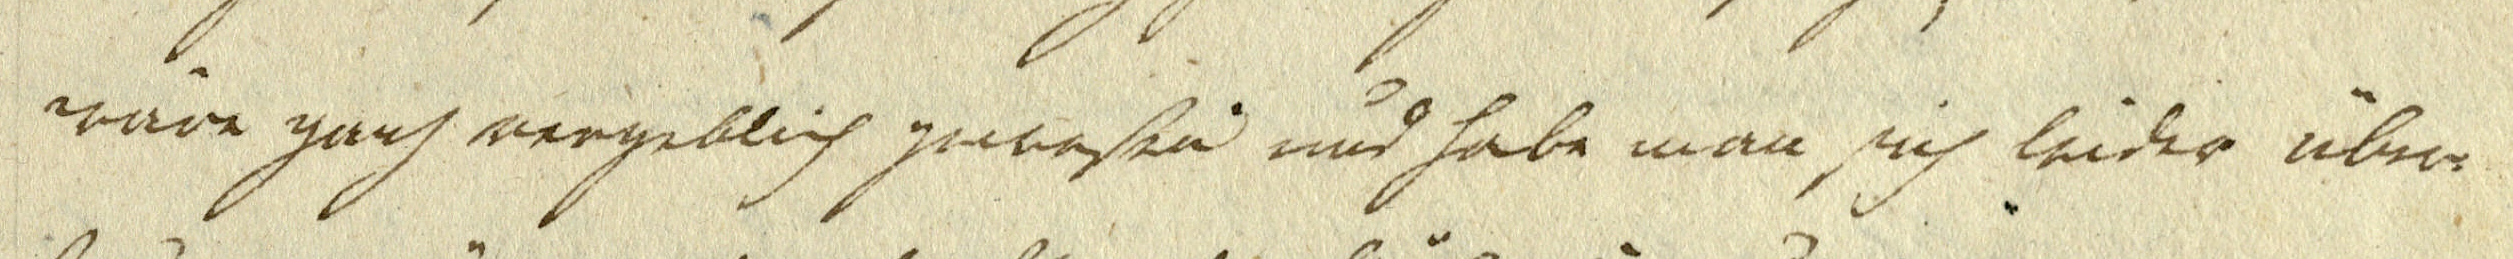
wäre ganz vergeblich gewesen und habe man sich leider über¬
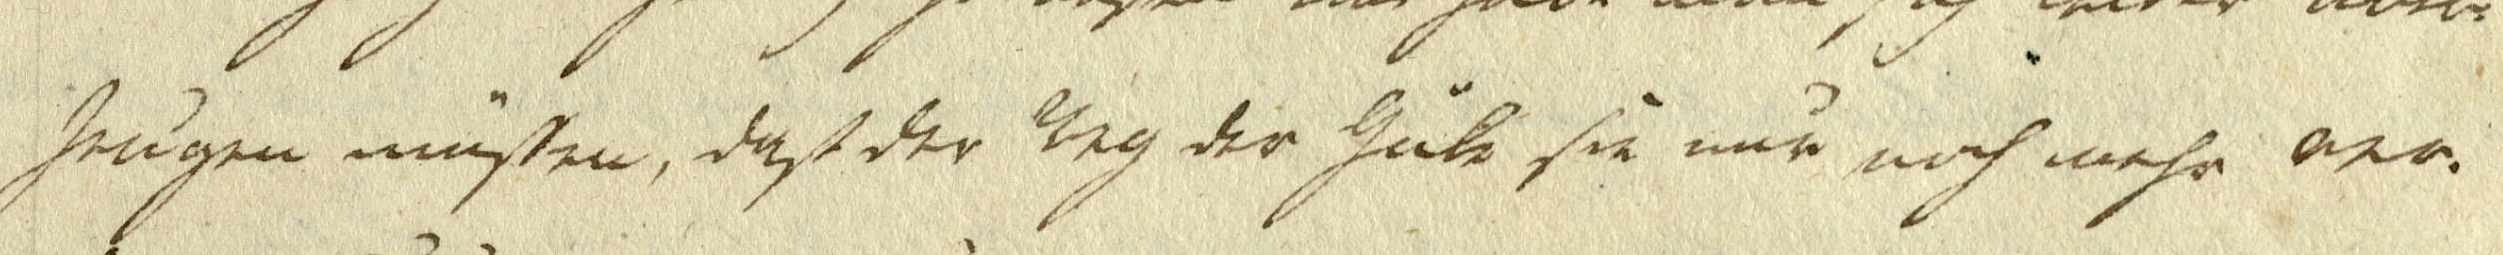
zeugen müssen, daß der Weg der Güte sie nur noch mehr ver¬
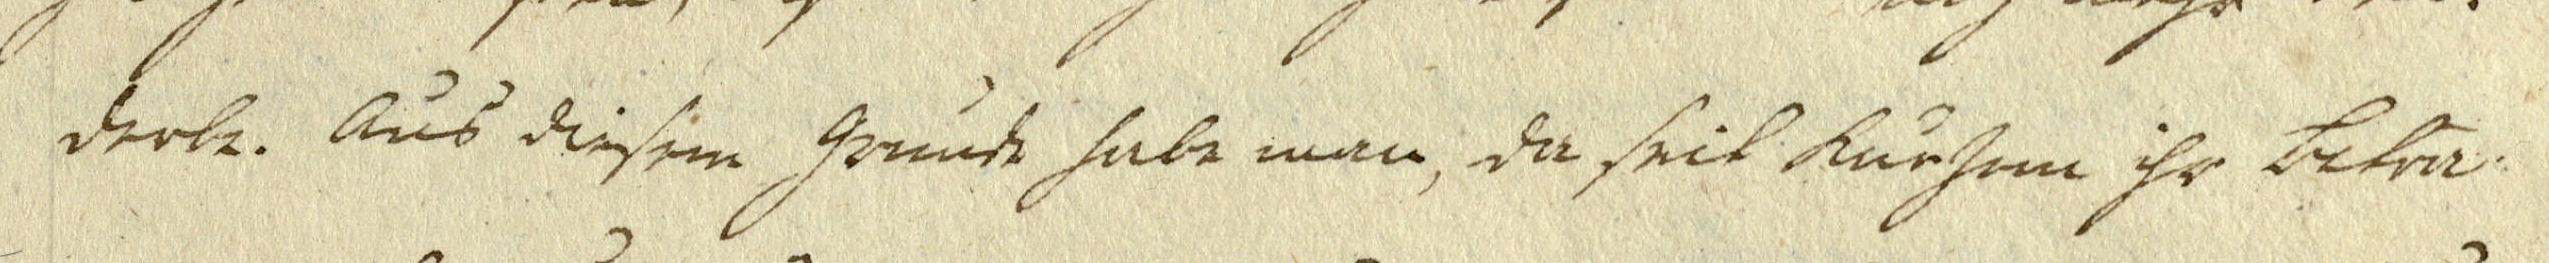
derbe. Aus diesem Grunde habe man, da seit kurzem ihr Betra¬
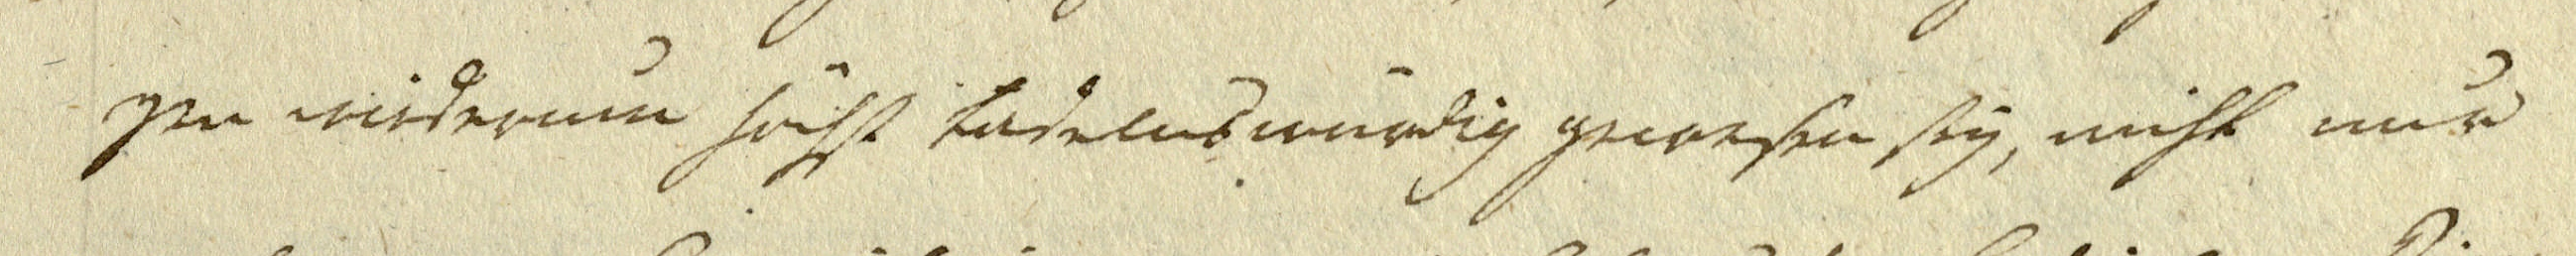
gen wiederum höchst tadelnswürdig gewesen seÿ, nicht nur
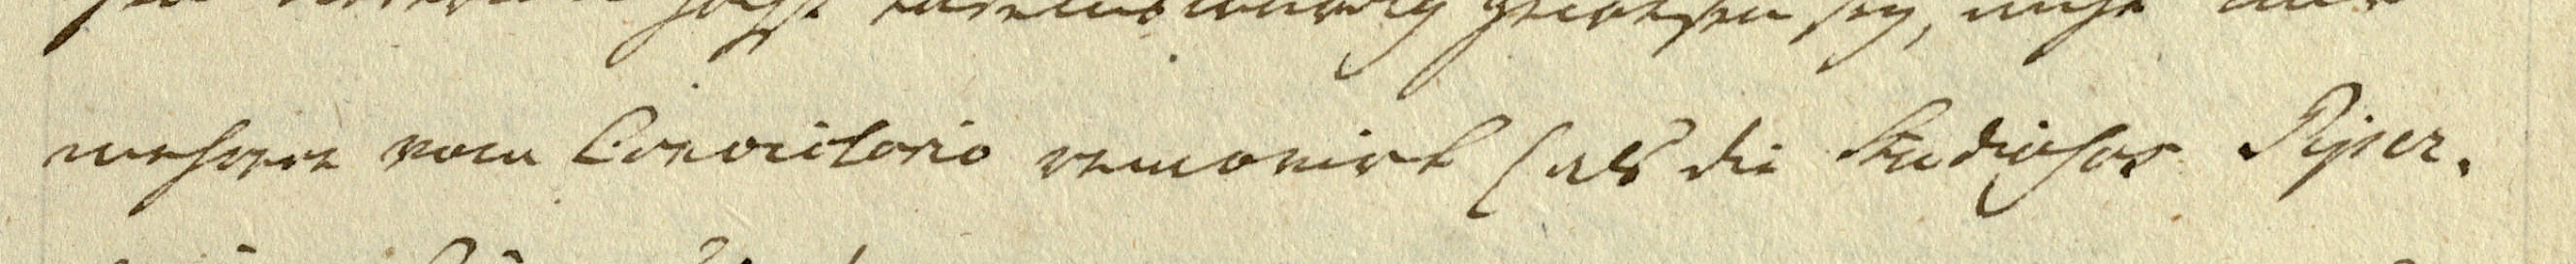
mehrere vom Convictorio remonirt ( als die Studiosos Piper,
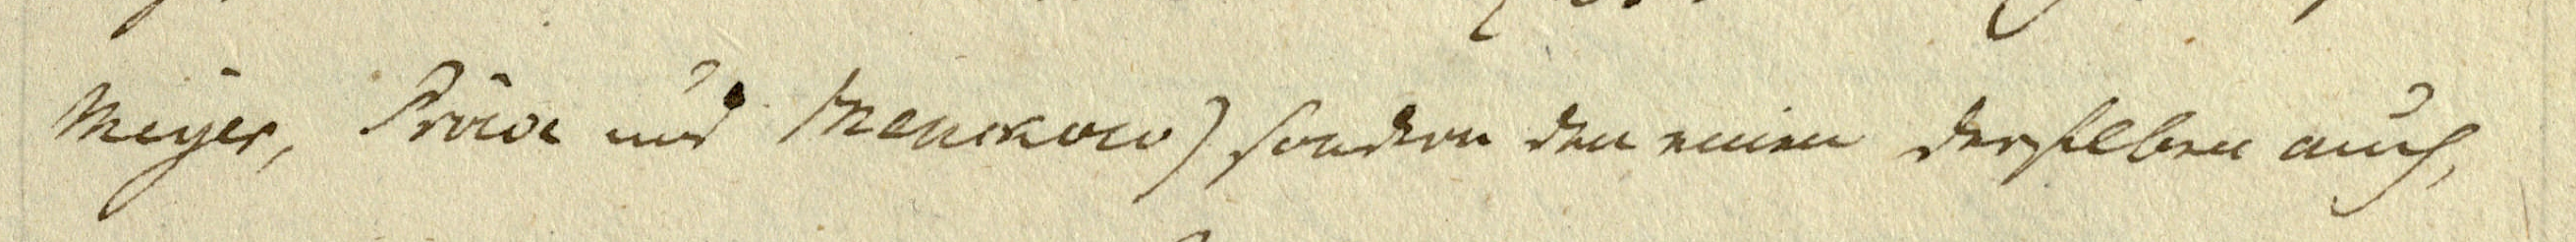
Meÿer, Präve und Menckow ) sondern den einen derselben auch,
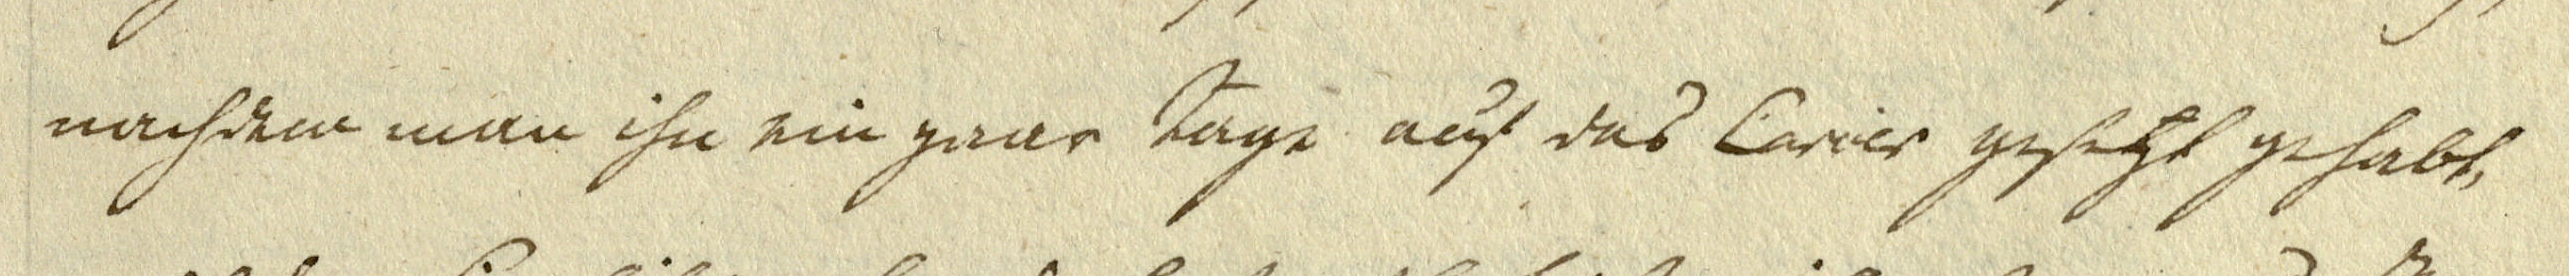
nachdem man ihn ein paar Tage auf das Carcer gesetzt gehabt,
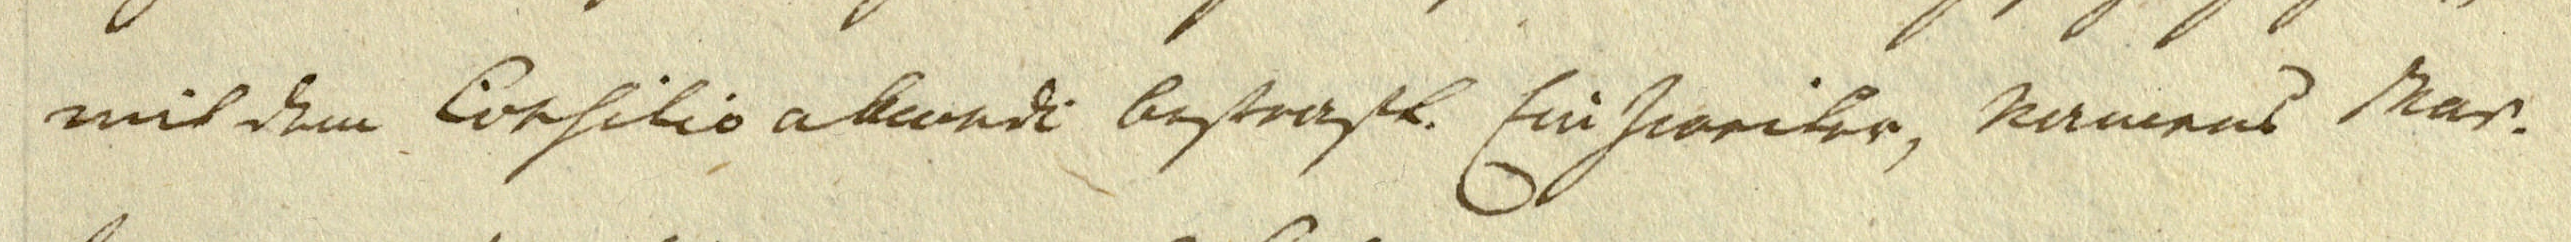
mit dem Consilio abeundi bestraft. Ein zweiter, Namens Mar¬
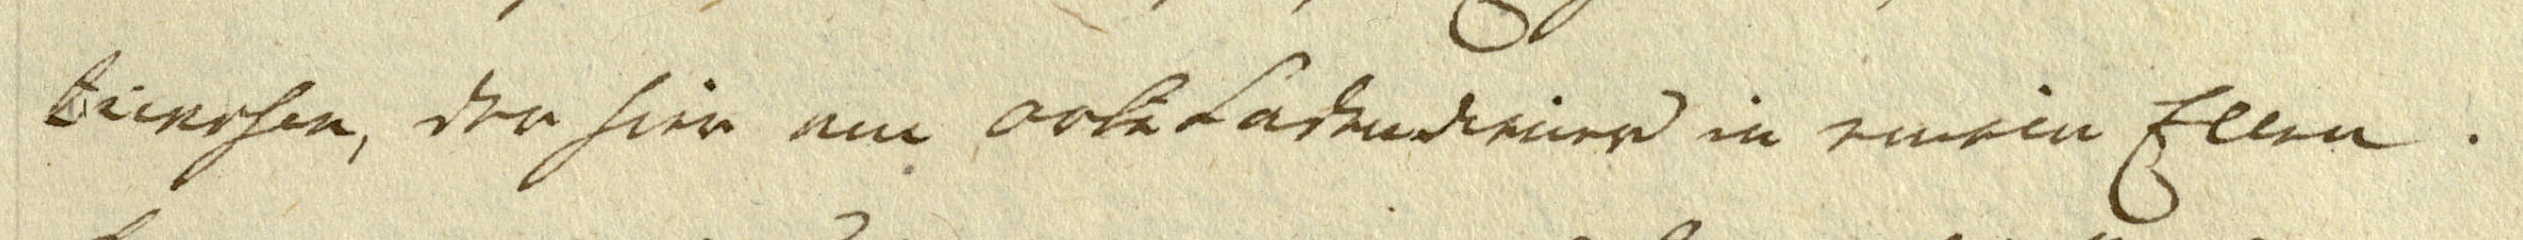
tinssen, der hier am Orte Ladendiener in einem Ellen¬
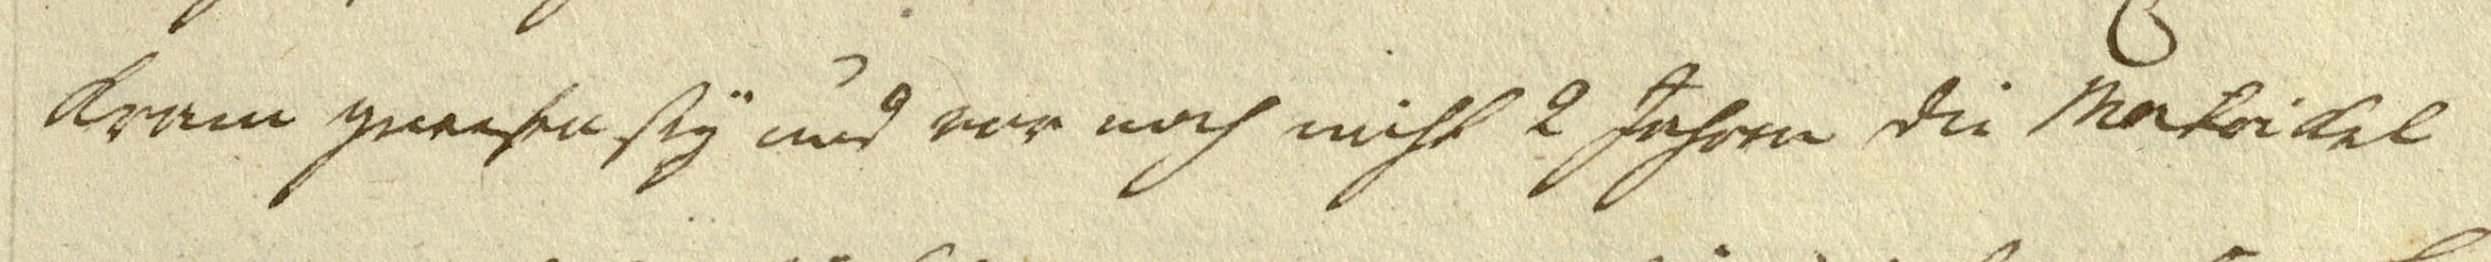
kram gewesen seÿ und vor noch nicht 2 Jahren die Matrikel
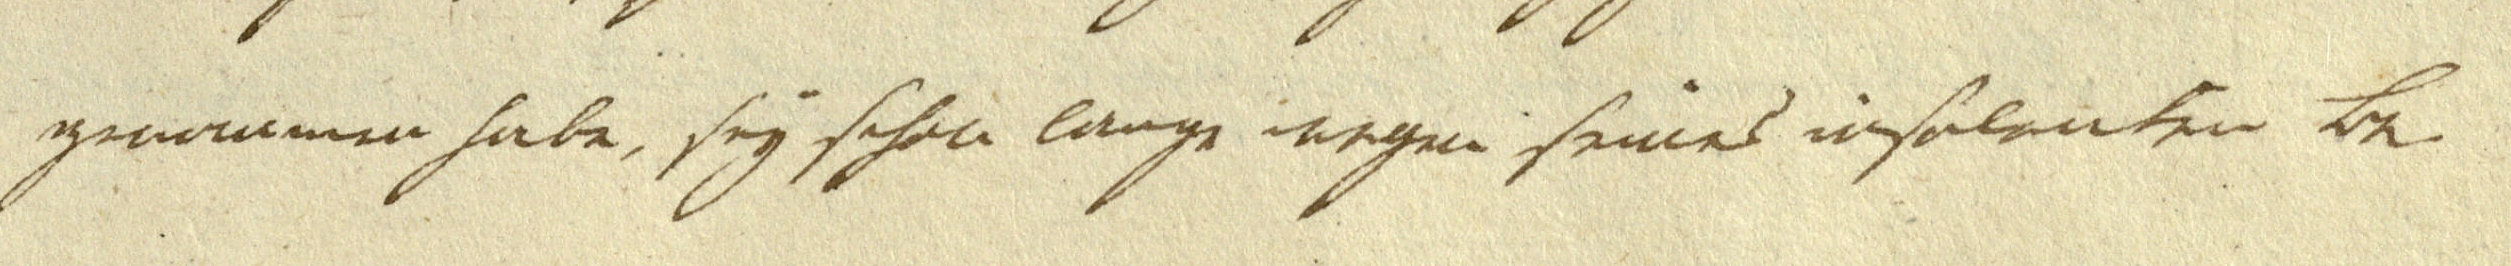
genommen habe, seÿ schon lange wegen seines insolenten Be¬
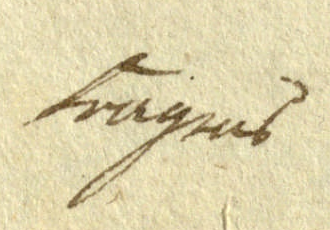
tragens
